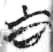吉
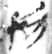利（利）
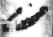㠯（以）
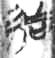結
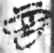言
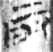取（娶）
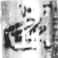妻
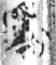○（嫁）
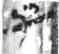子
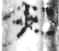內（入）
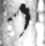人
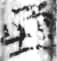城（成）
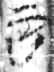言
